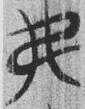弗
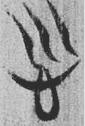○（順）
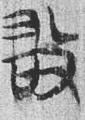敢
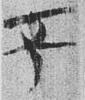不
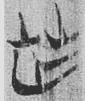芒
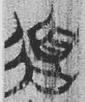道
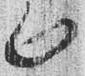㠯（以）
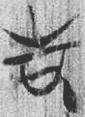告
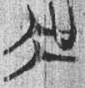吳
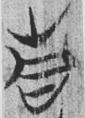青（請）
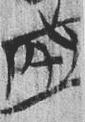城（成）
